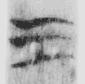三
